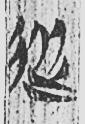從
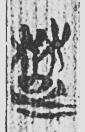楚
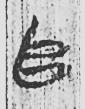𠂤
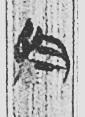於
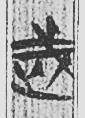武
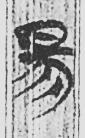昜
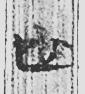甲
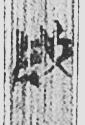戌
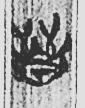晉
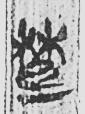楚
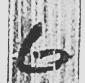㠯（以）
